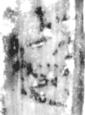妻
